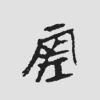坪
